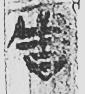周
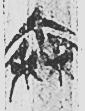秦
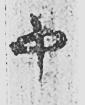中
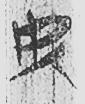𡚦
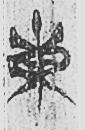東
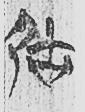居
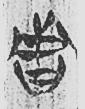周
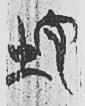地
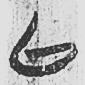㠯（以）
